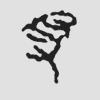𠭁
